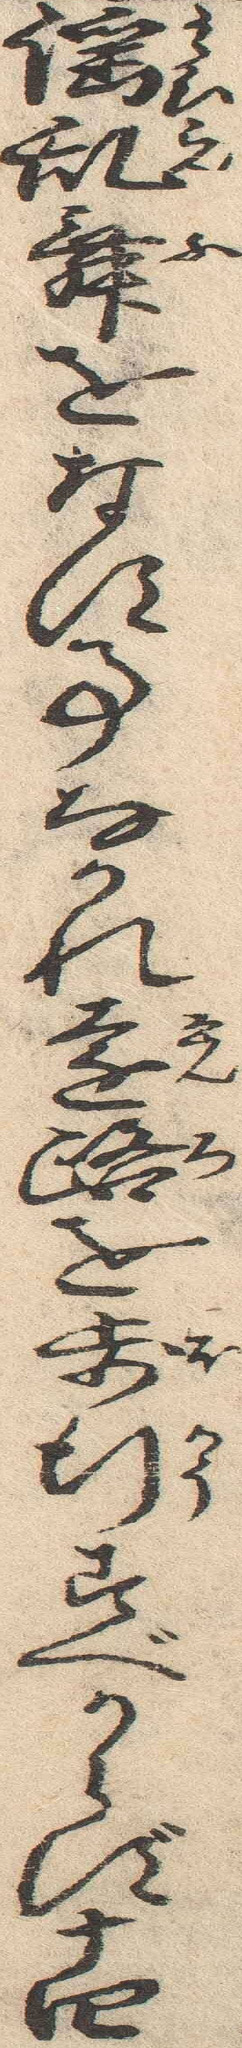謡乱舞をなす事なかれ遠路を歩行すべからず十四
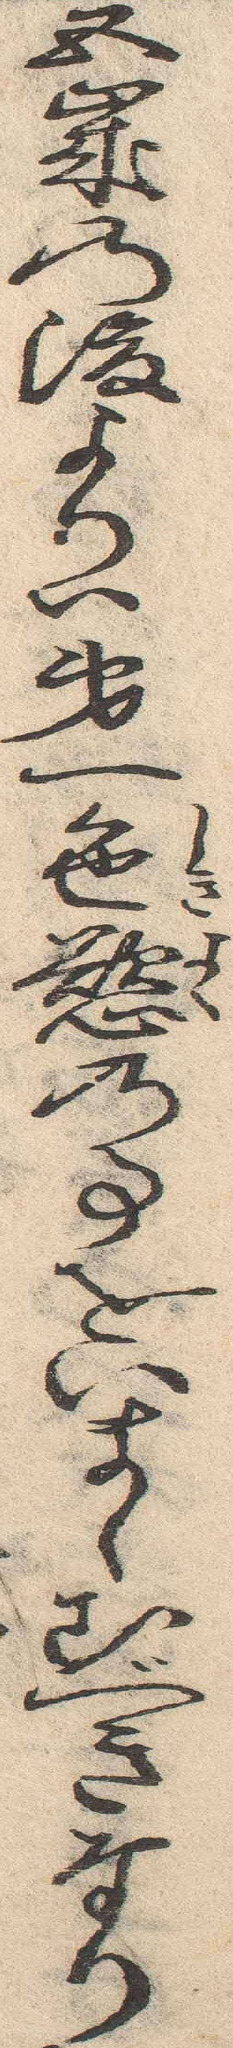五歳の後よりは第一色欲の事をいましむべきなり
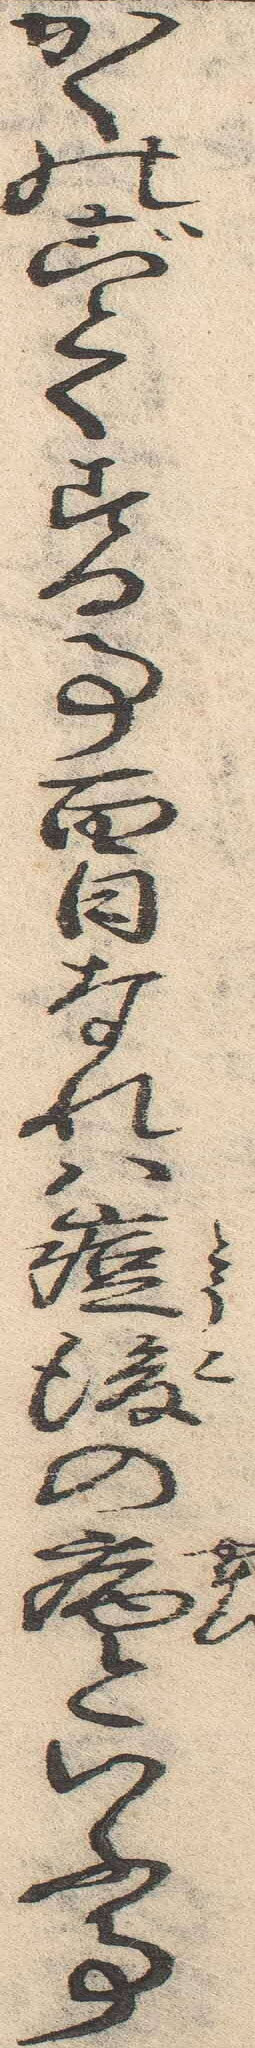かくのごとくする事百日なれは痘後の病といふ事
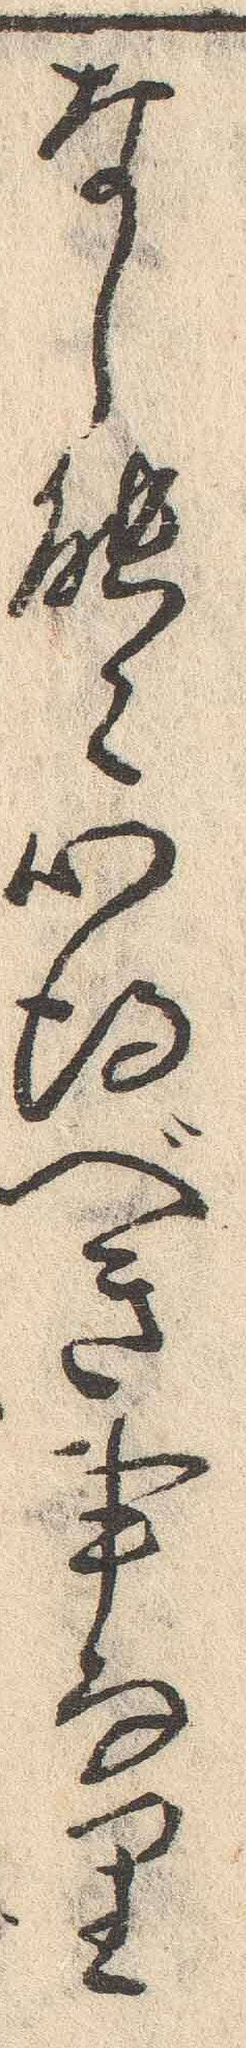なし能々心得べき事なり
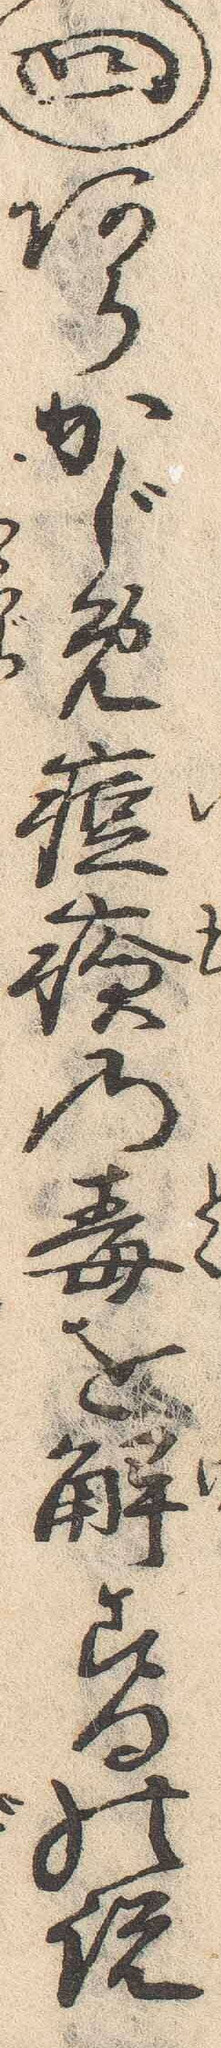㊃あらかじめ痘の毒を解するの説
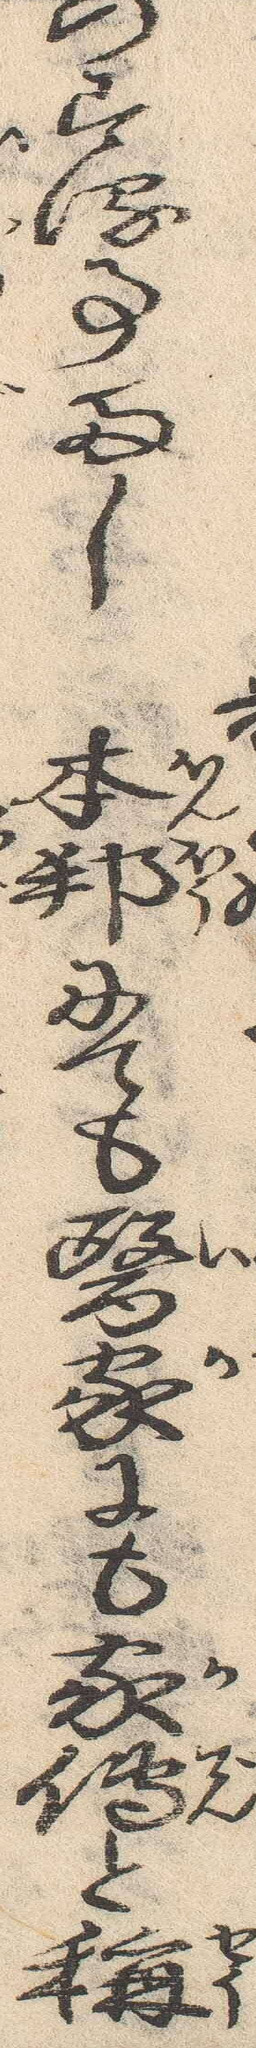のする事多し本邦にても医家にも家伝と称
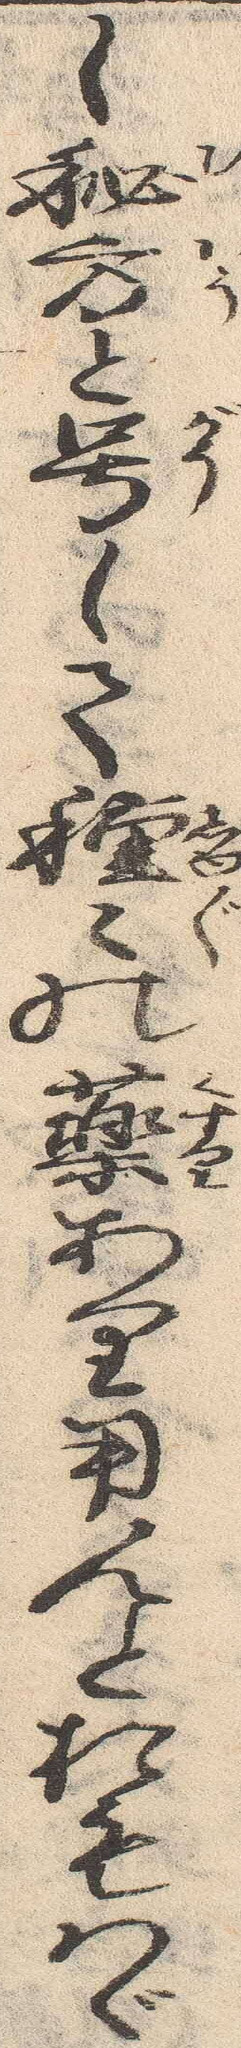し秘方と号して種々の薬あり用んとおもはゞ
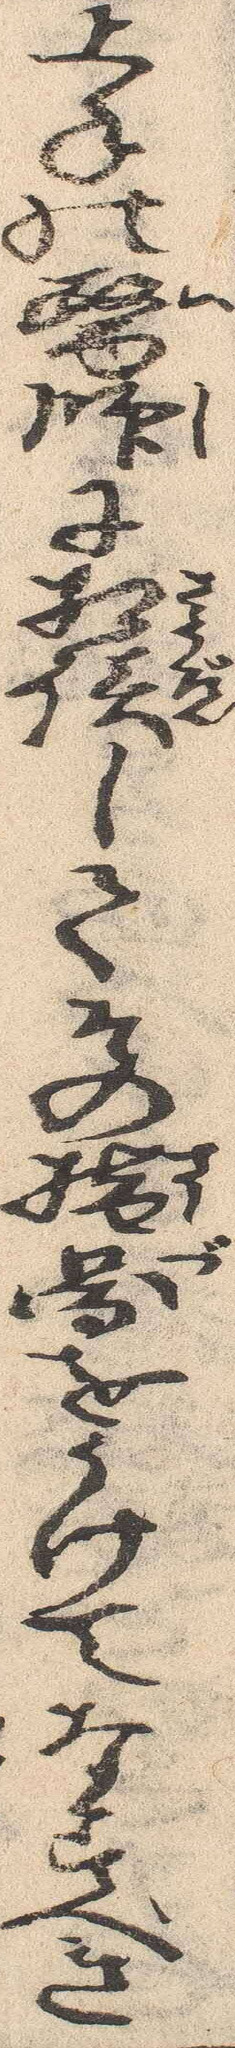上手の医師に相談してその指図をうけてなすべき
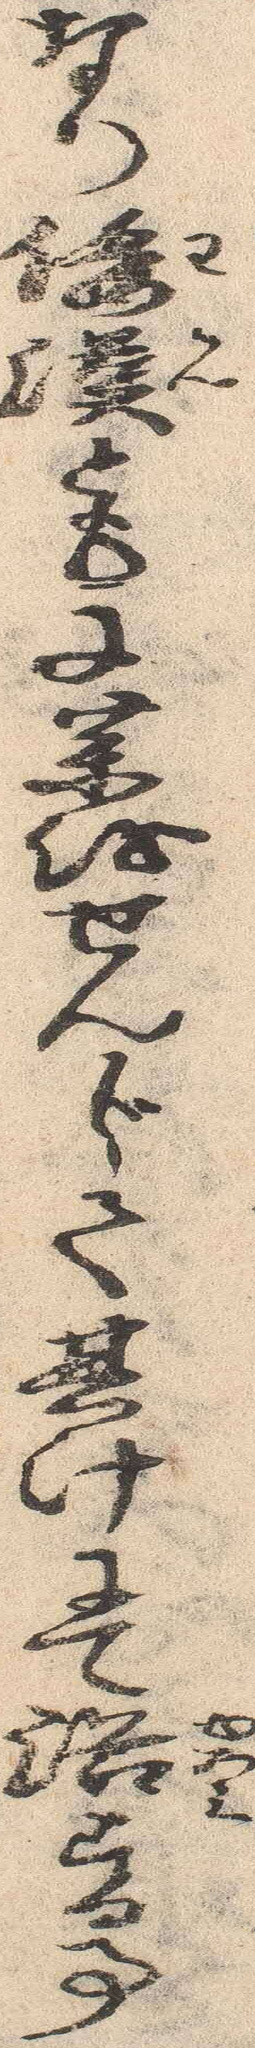なり倭漢ともに薬をせんじて其汁にて浴する事
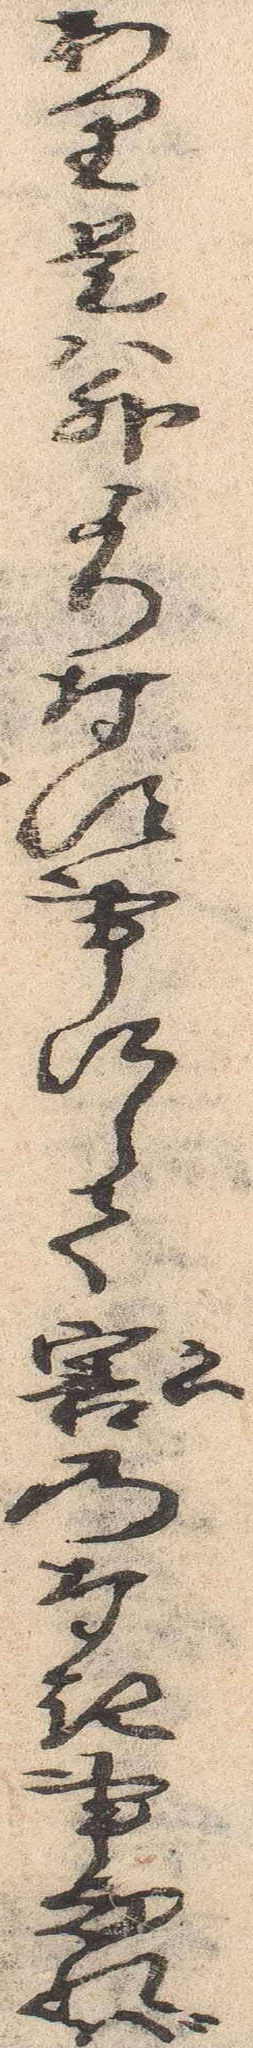あり是は外よりなす事にして害のなき事なれば
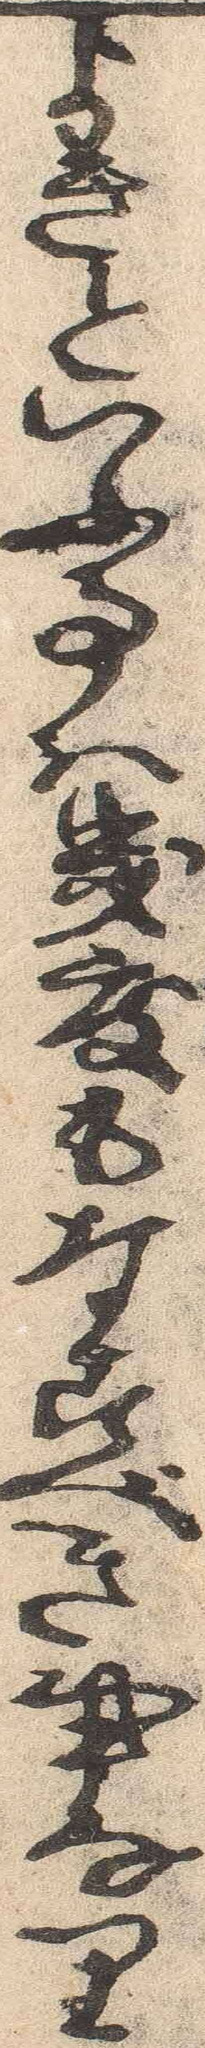よきといふ事は幾度もなすべき事なり
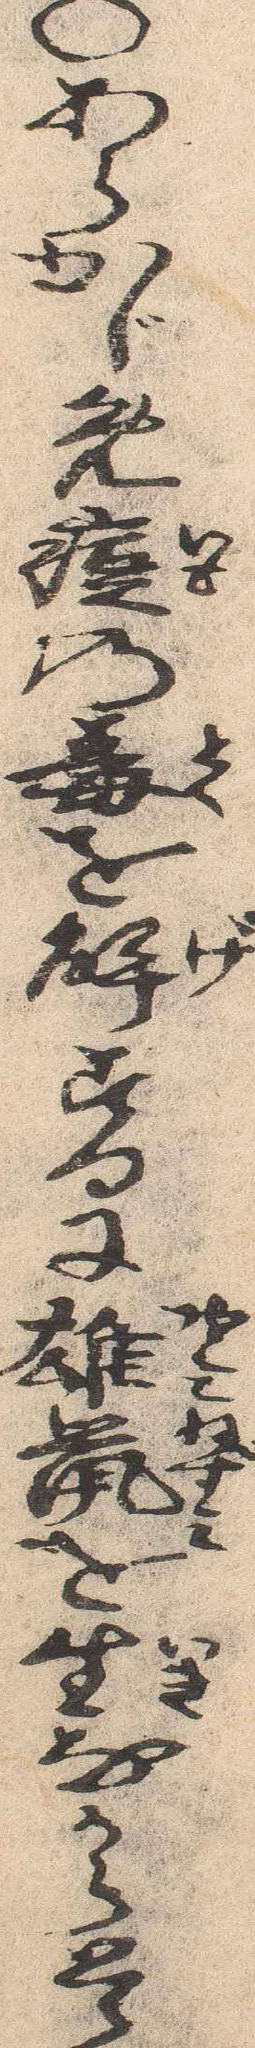○あらかじめ痘の毒を解するに雄鼠を生なからとら
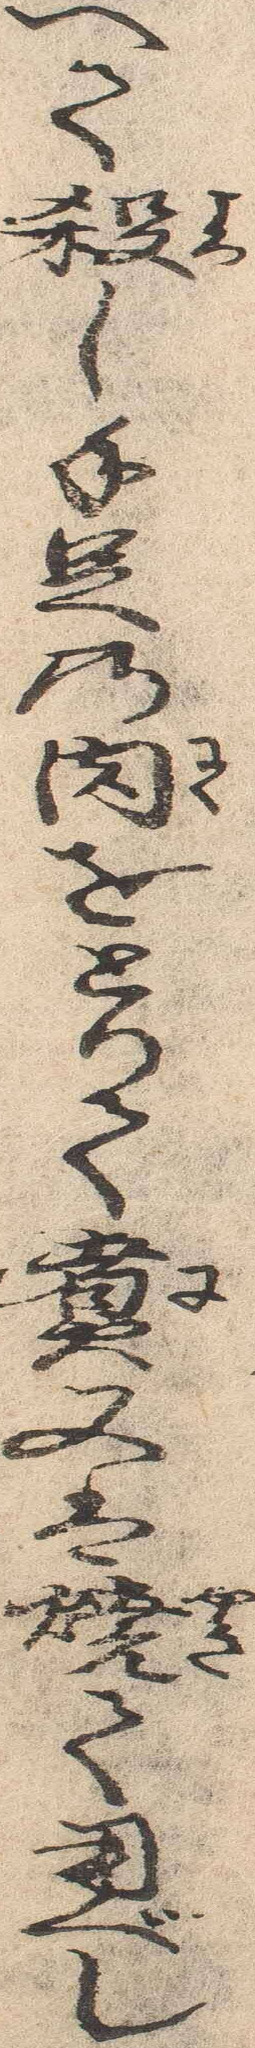へて殺し手足の肉をとりて煮又は焼て用べし
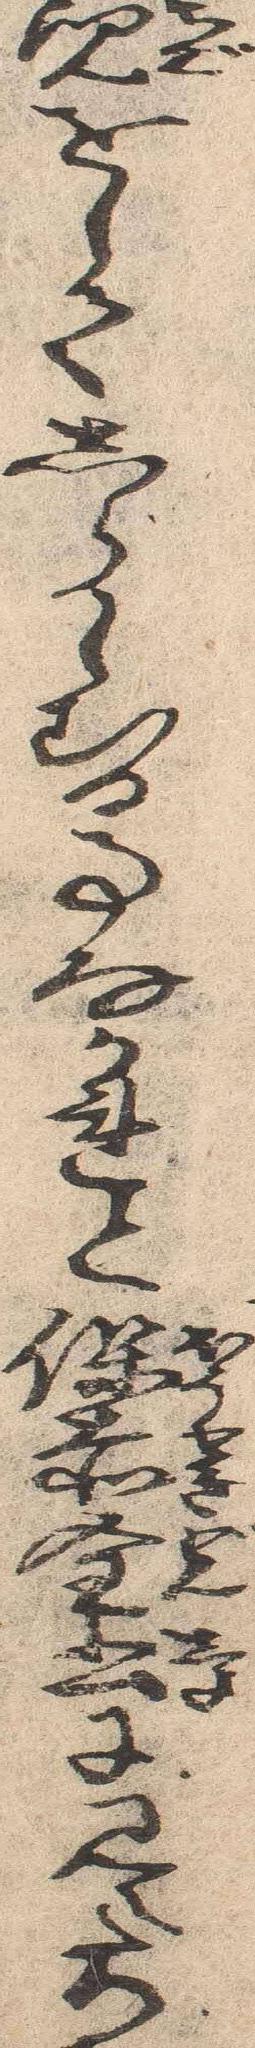児をしてしらしむる事なかれと保赤全書に見えたり
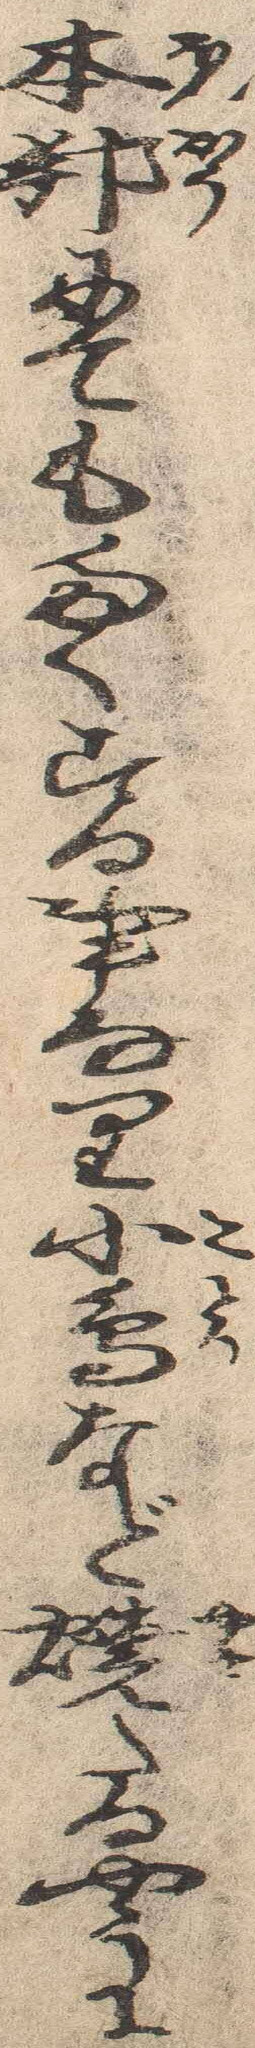本邦にても多くする事なり小鳥など焼たるやうに
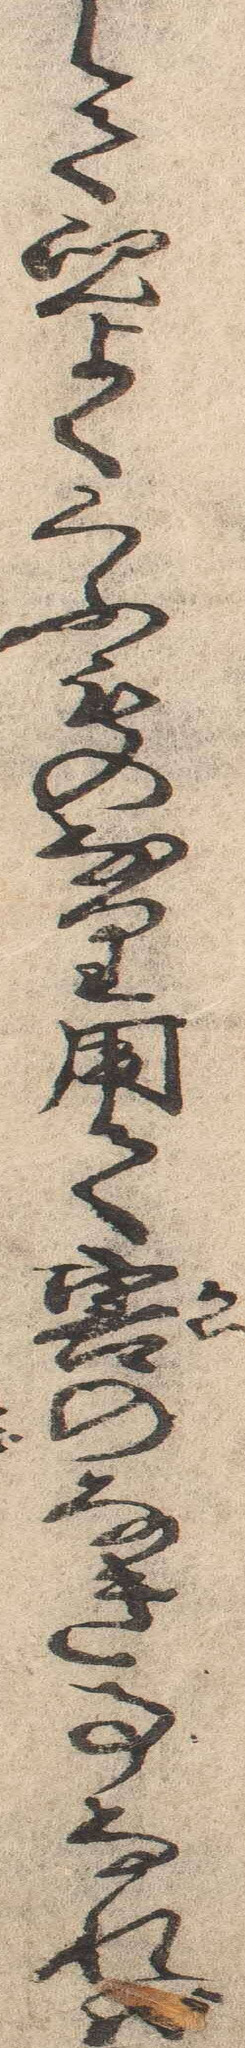して児よくくふものなり用て害のなき事なれば
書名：小児必用養育草
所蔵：東京学芸大学附属図書館 国文学研究資料館
